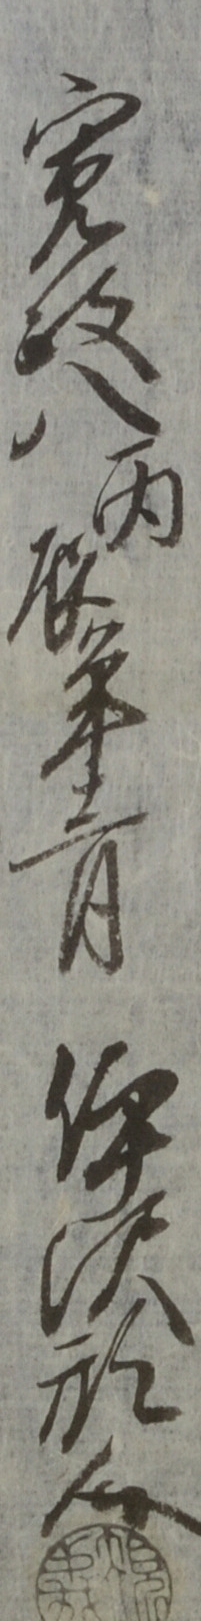寛政八丙辰年三月伊沢形介㊞
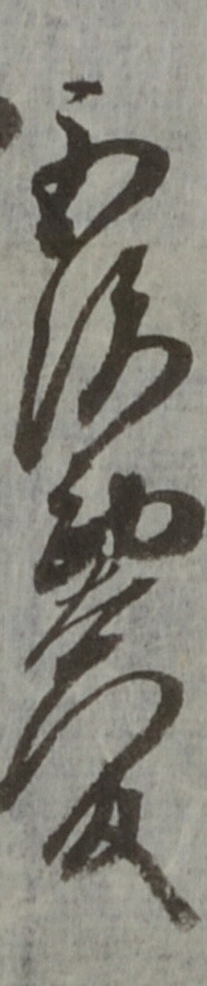宮沢勘右衛門殿
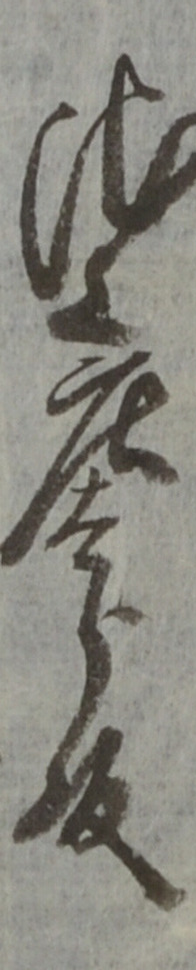池上庄太郎殿
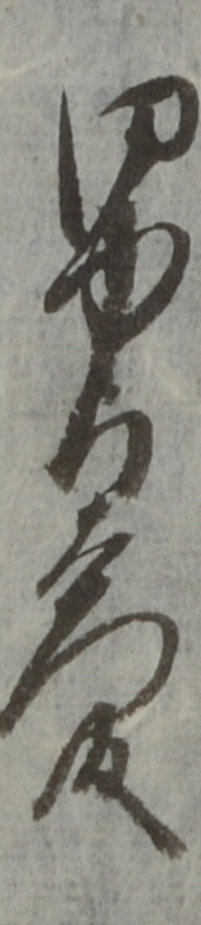田中与右衛門殿
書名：覚
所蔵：伊那市立高遠町図書館・合同会社AMANE
